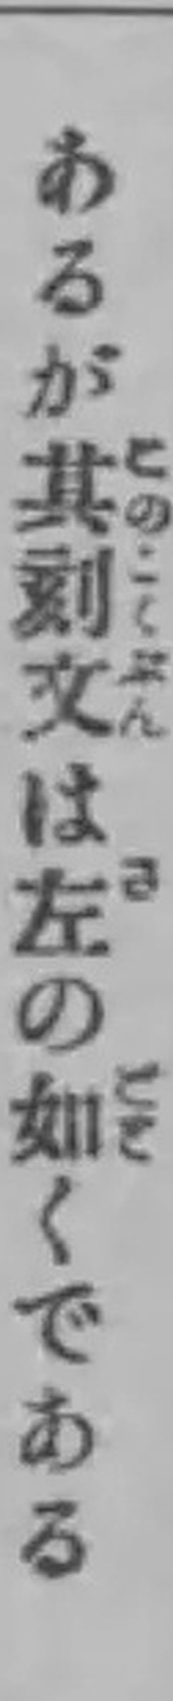あるが此刻文は左の如くである
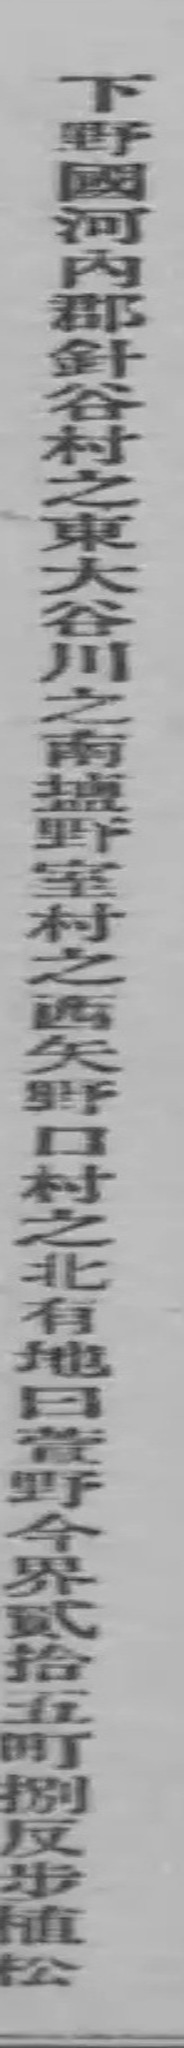下野国河内郡針谷村之東大谷川之南塩野室村之西矢野口村之北有地曰萱野今界弐拾五町捌反歩植松
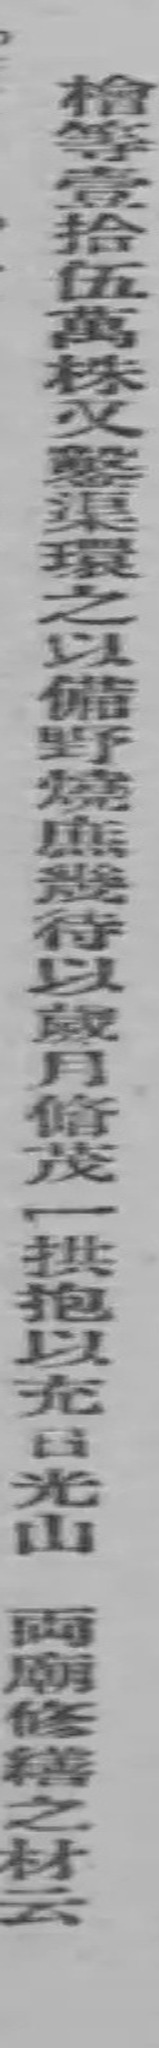桧等壱拾五万株又鑿渠環之以備野焼庶幾待以歳月修茂一拱抱以充日光山両廟修繕之材云
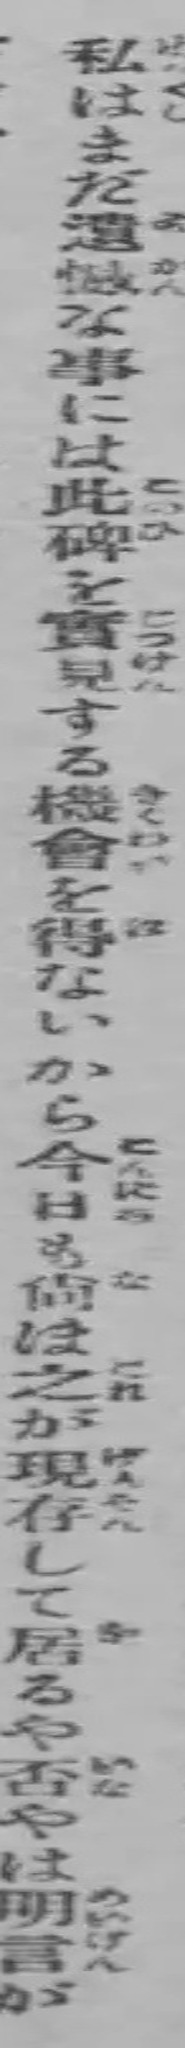私はまだ遺憾な事には此碑を実見する機会を得ないから今日も尚ほ之が現存して居るや否やは明言が
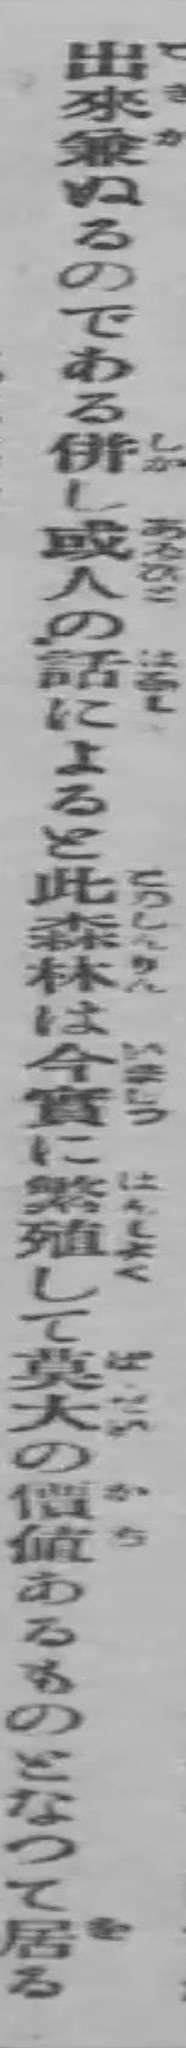出来兼ぬるのである併し或人の話によると此森林は今実に繁殖して莫大の価値あるものとなつて居る
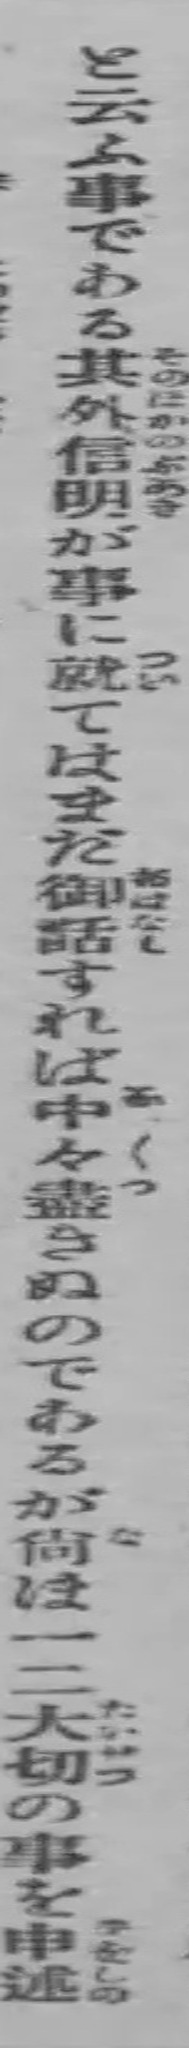と云ふ事である其外信明が事に就てはまだ御話すれば中々尽きぬのであるが尚ほ一二大切の事を申述
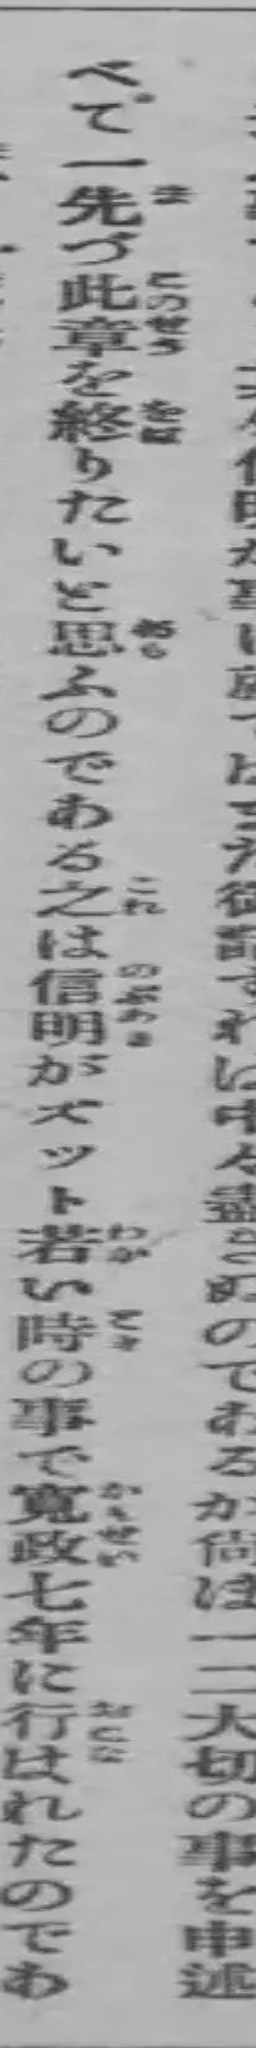べて一先づ此章を終りたいと思ふのである之は信明がズツト若い時の事で寛政七年に行はれたものであ
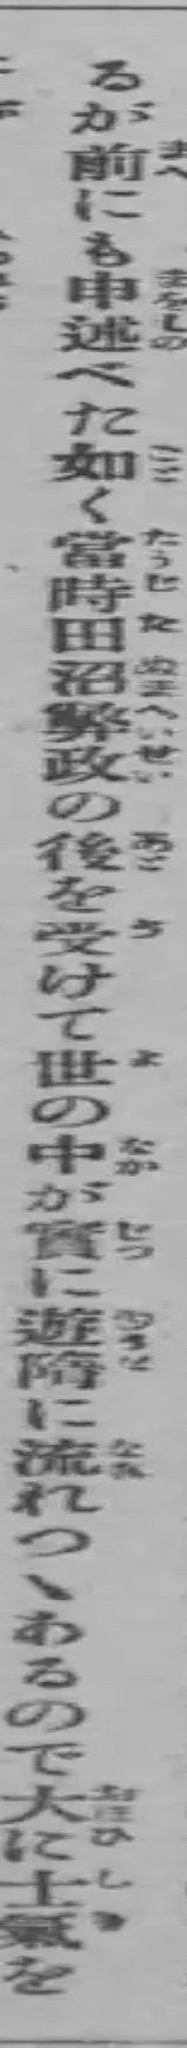るが前にも申述べた如く当時田沼弊政の後を受けて世の中が実に遊惰に流れつゝあるので大に士気を

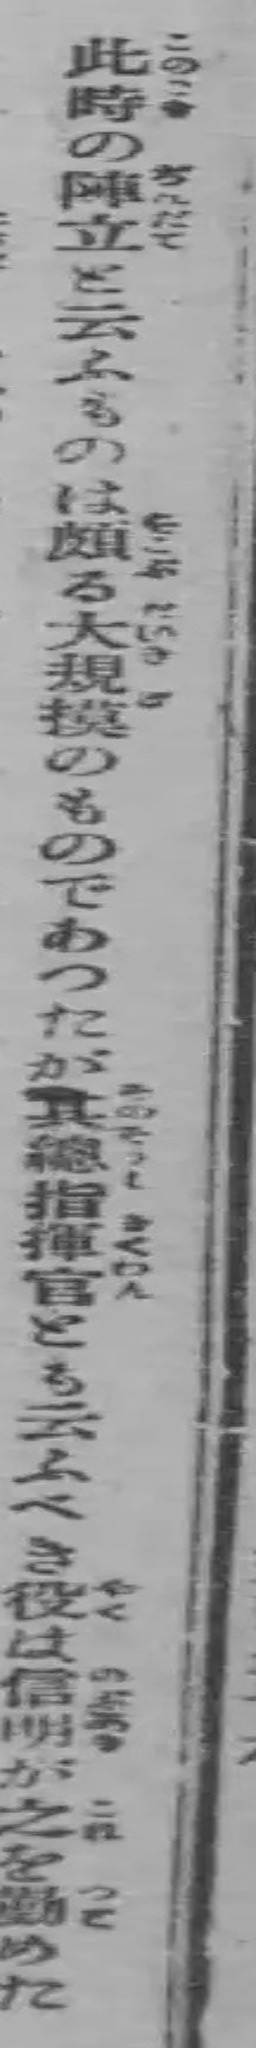此時の陣立と云ふものは頗る大規模のものであつたが其総指揮官とも云ふべき役は信明が之を勤めた
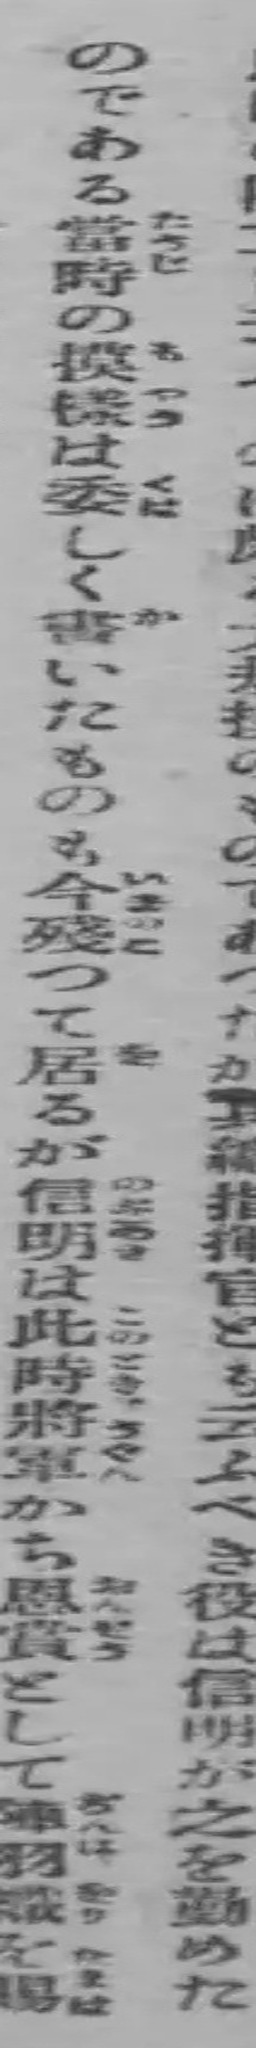のである当時の模様は委しく書いたものも今残つて居るが信明は此時将軍から恩賞として陣羽織を賜
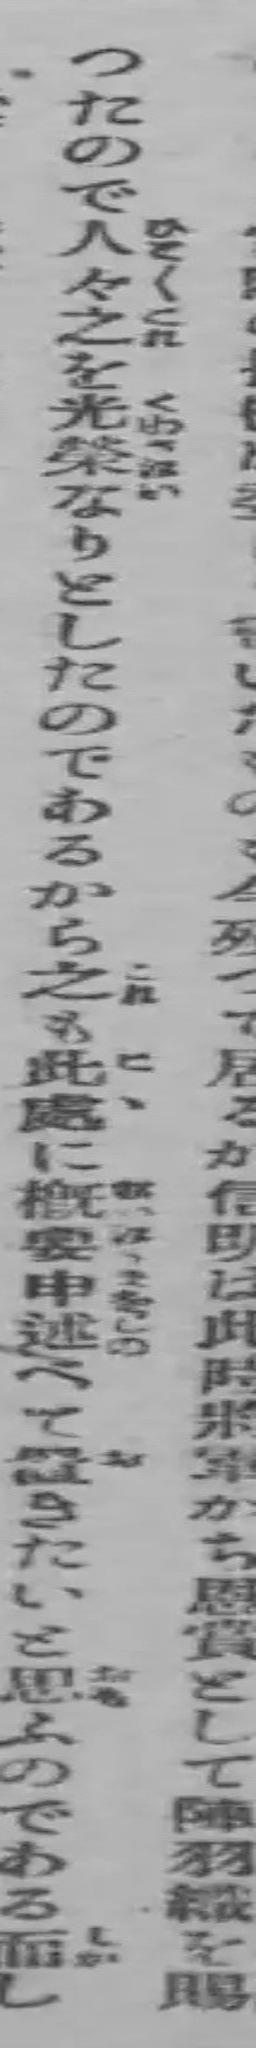つたので人々之を光栄なりとしたのであるから之も此処に概要申述べて置きたいと思ふのである而し
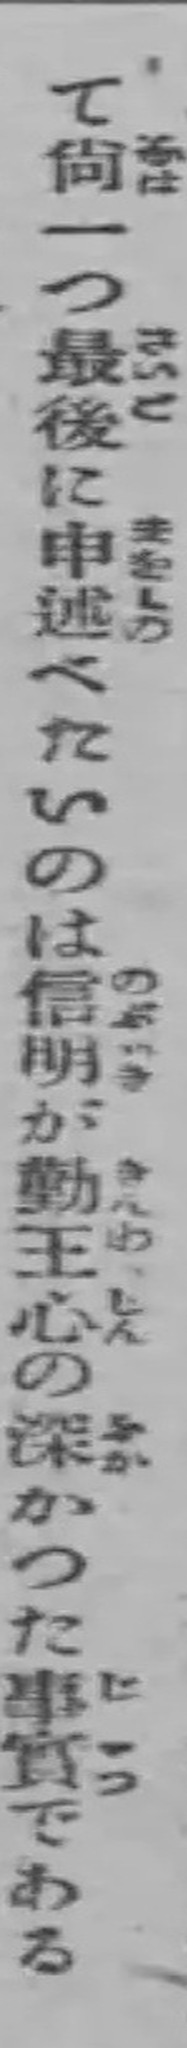て尚一つ最後に申述べたいのは信明が勤王心の深かつた事実である
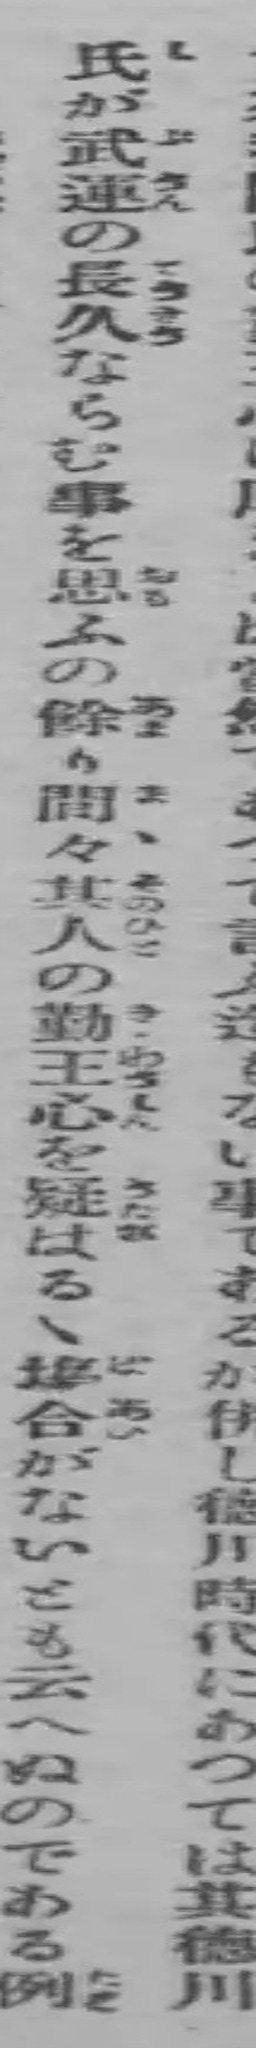氏が武運の長久ならむ事を思ふの余り間々其人の勤王心を疑はるゝ場合がないとも云へぬのである例
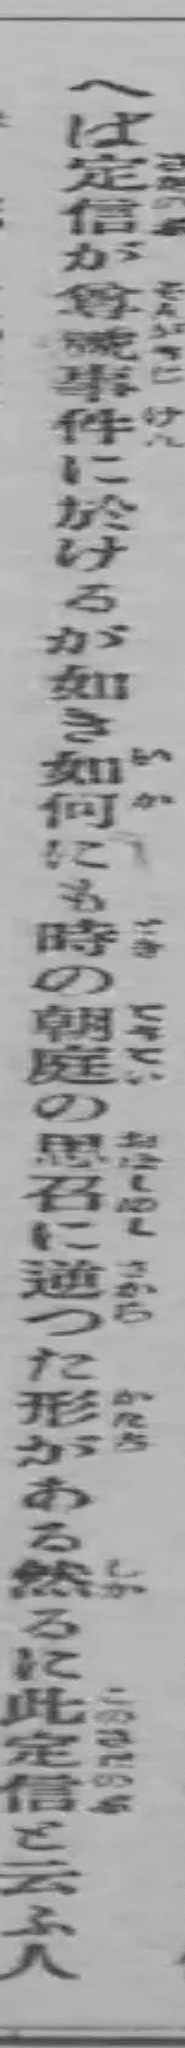へば定信が尊号事件に於けるが如き如何にも時の朝庭の思召に逆つた形がある然るに此定信と云ふ人
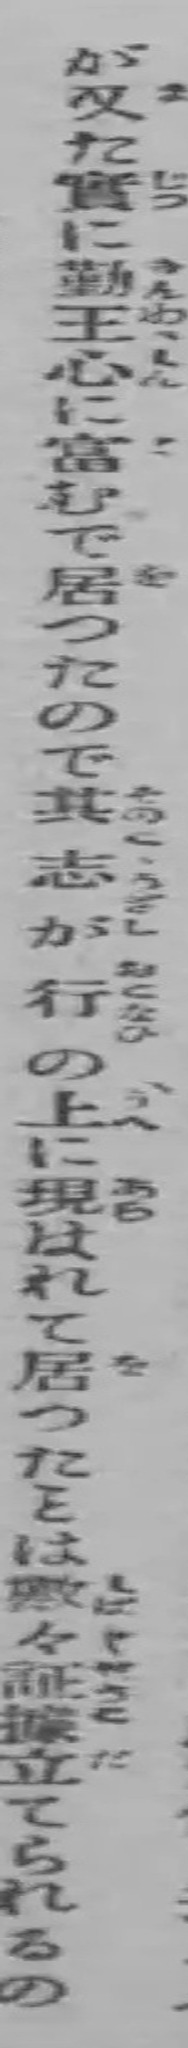が又た実に勤王心に富むで居つたので其志が行の上に現はれて居つたことは数々証拠立てられるの
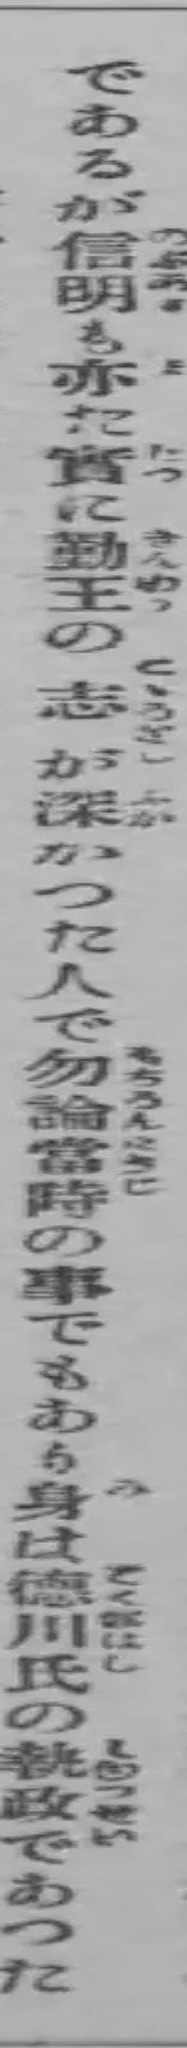であるが信明も亦た実に勤王の志が深かつた人で勿論当時の事でもあり身は徳川氏の執政であつた
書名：豊橋市史談
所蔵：国立国会図書館 National Diet Library, JAPAN
